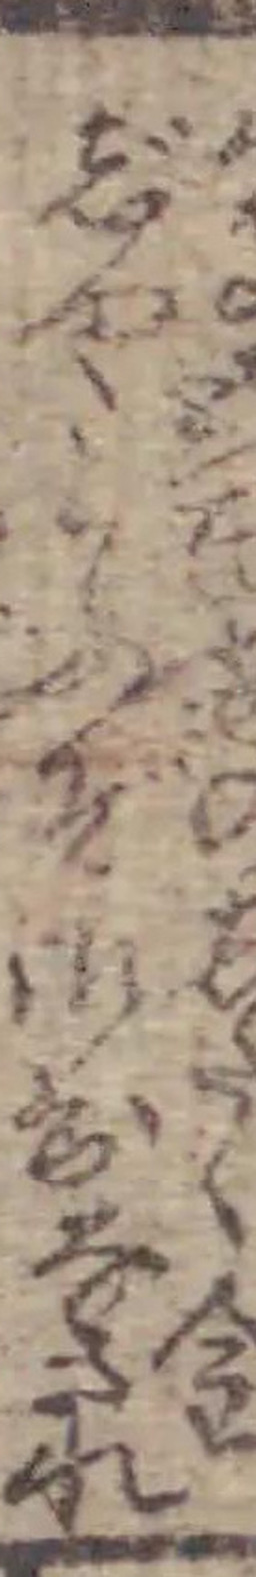じやとふぞ御出なされ
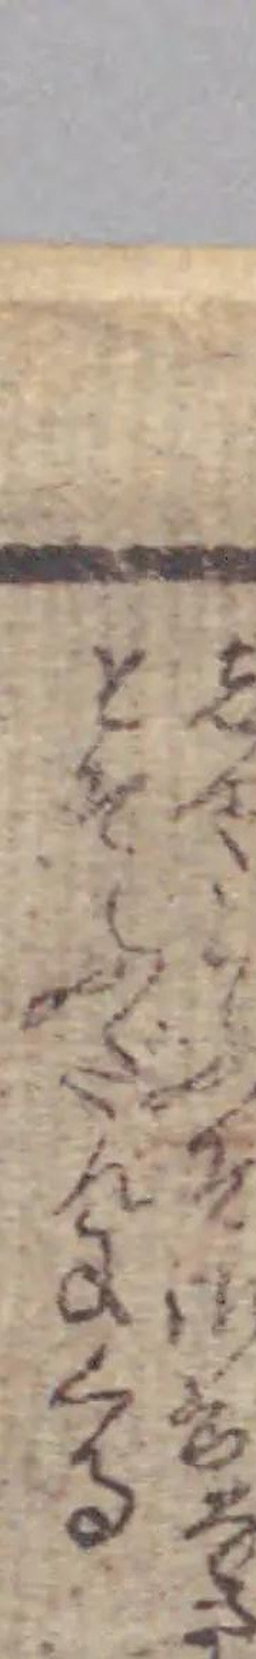とそふだんにくる
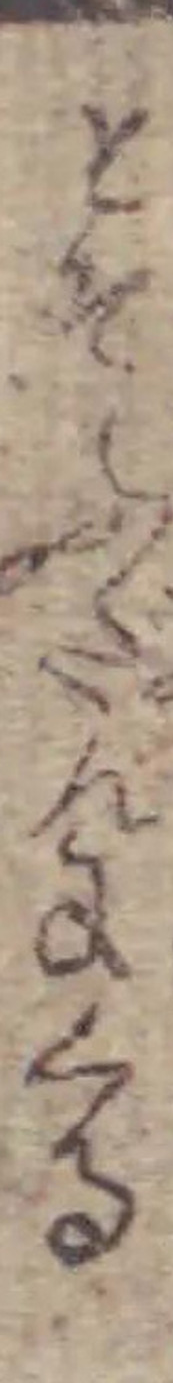とそふだんにくる

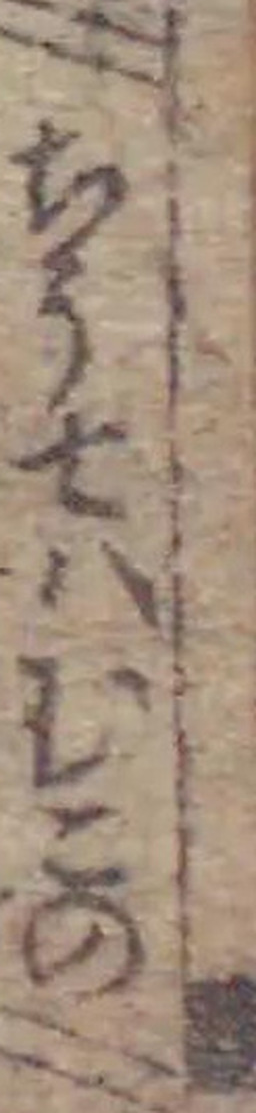ちう七はむこの
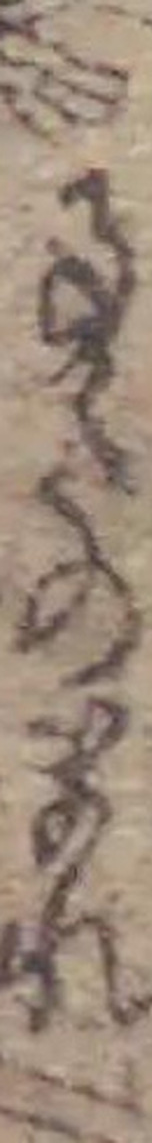事たのまれ
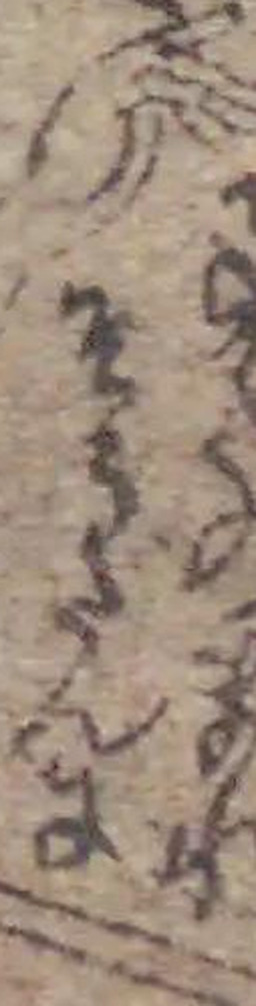そうたんに
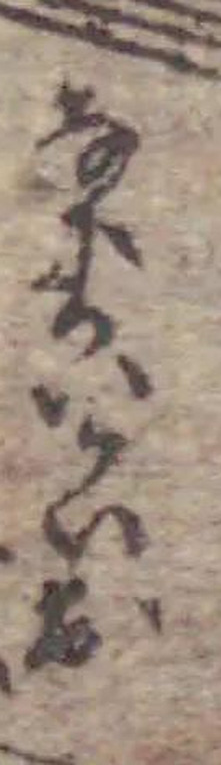なにいかいお
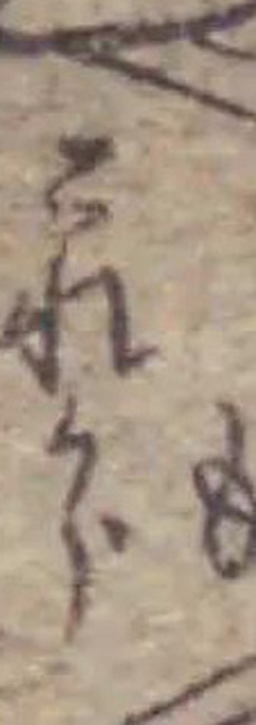これから
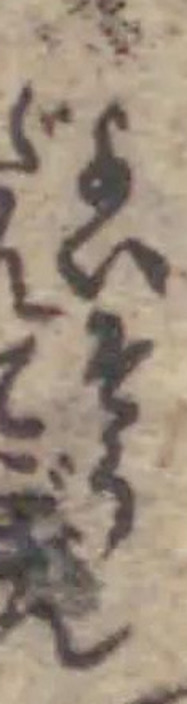よいそう
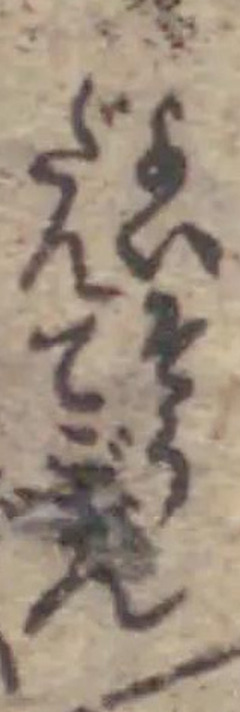だんてござん

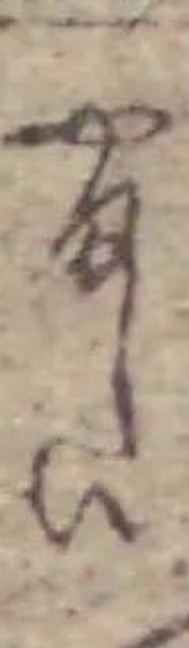やましい
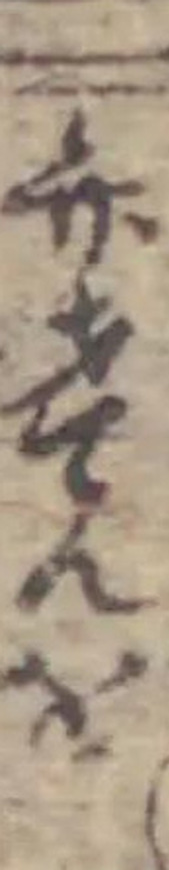弁才てんを
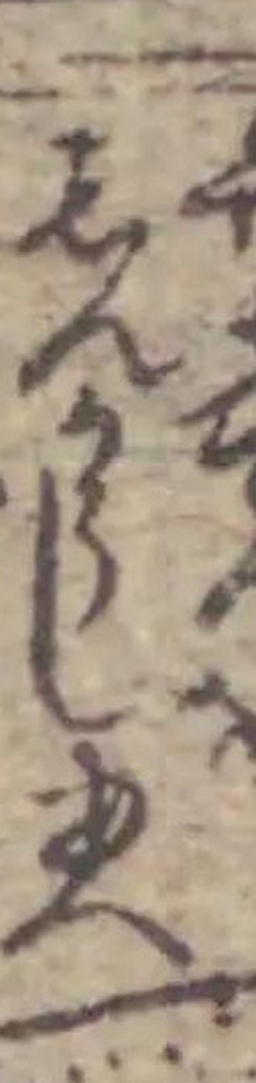しんかうしゆへ
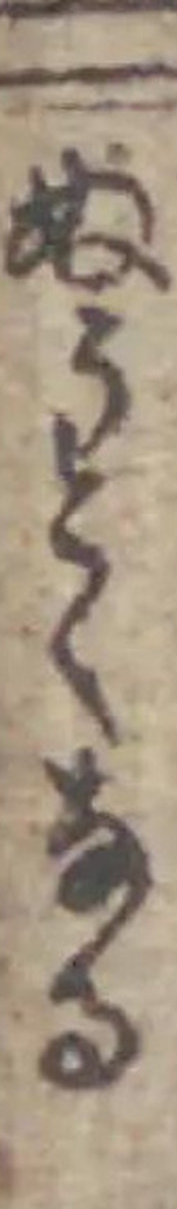ぬうとくなる
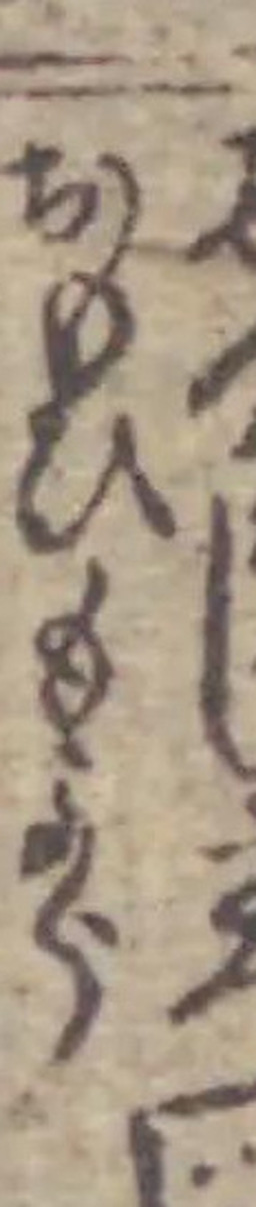おもひもよら
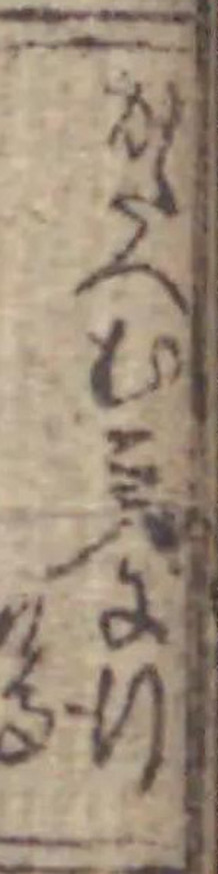かたへむこ入に行
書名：日待御利生此ごろ噂 3巻
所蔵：国立国会図書館 National Diet Library, JAPAN
